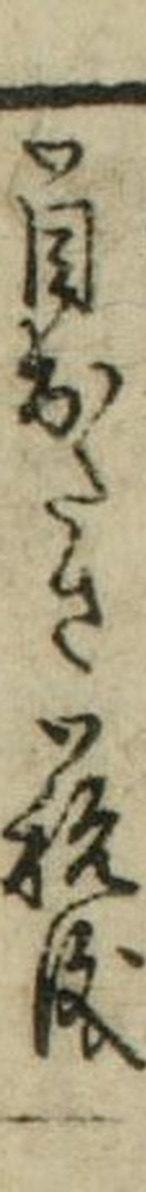御目出たき御祝儀
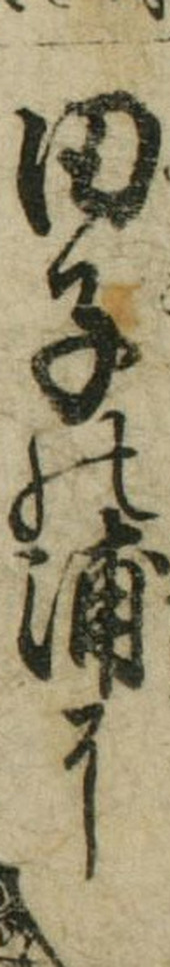田子の浦に
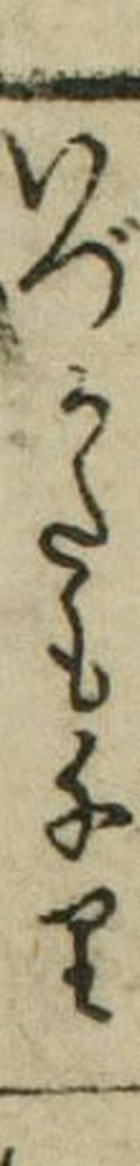いづかたも千里
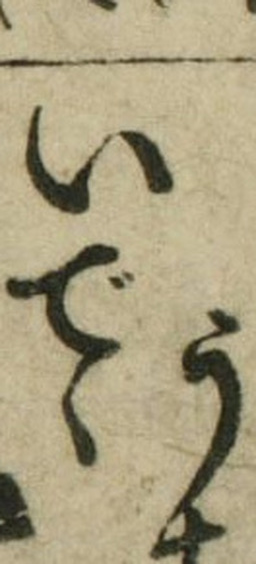いでゝ
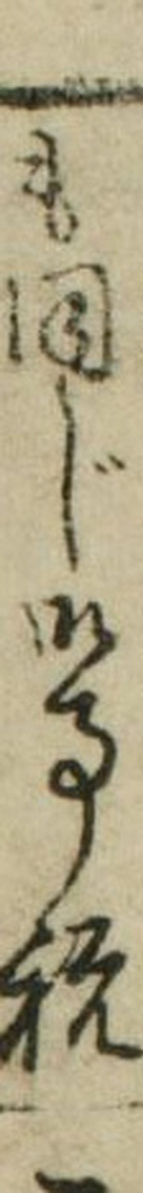も同じ御事祝
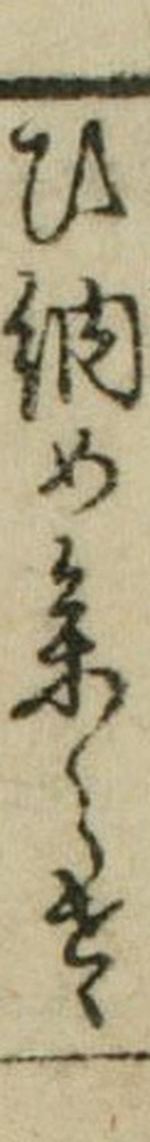ひ納参らせ候
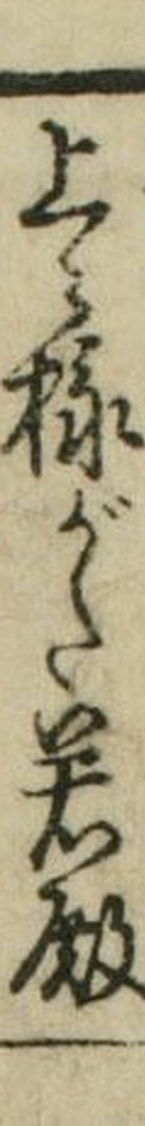上々様がた若殿
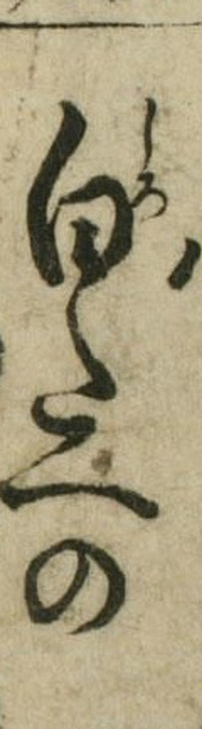白たへの
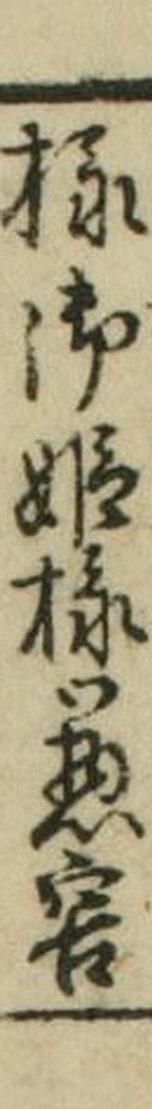様御姫様御惣容
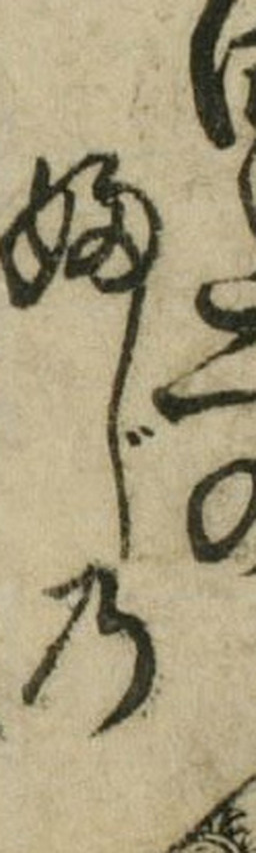ふじの
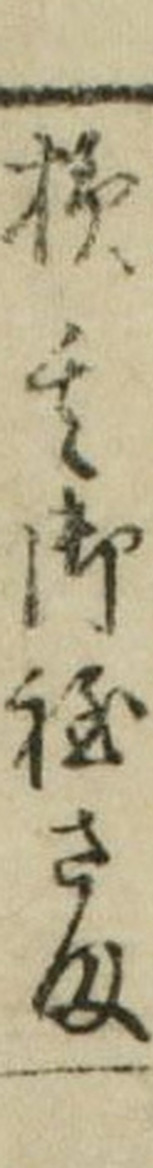様其御程さま
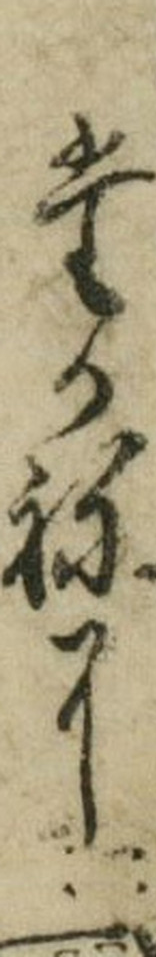たかねに
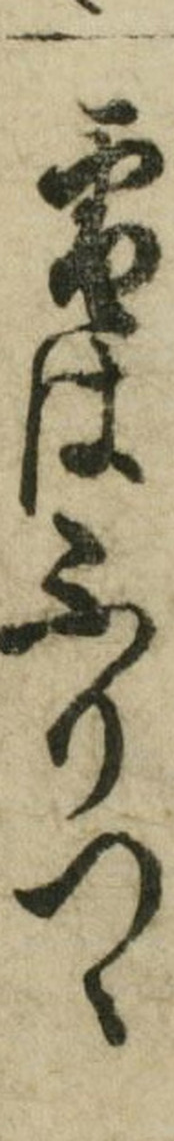雪はふりつゝ
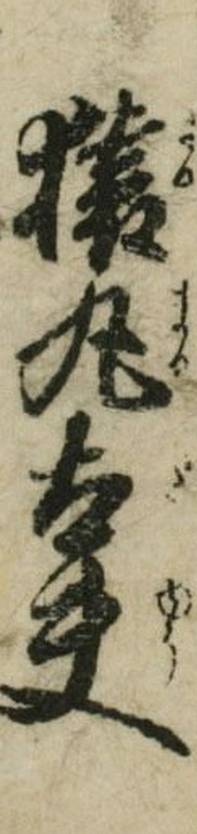猿丸太夫
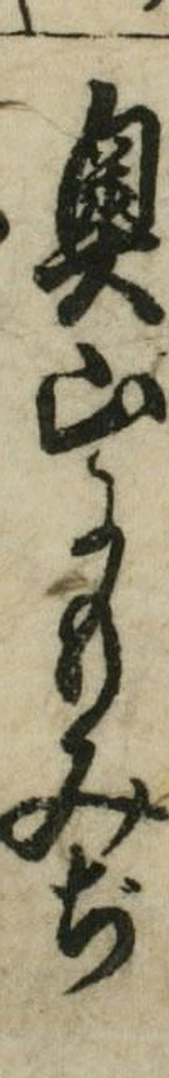奥山にもみぢ
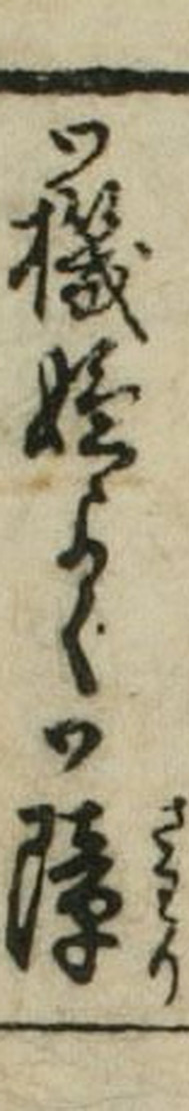御機嫌よく御障
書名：百人一首
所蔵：東京学芸大学教育コンテンツアーカイブ
